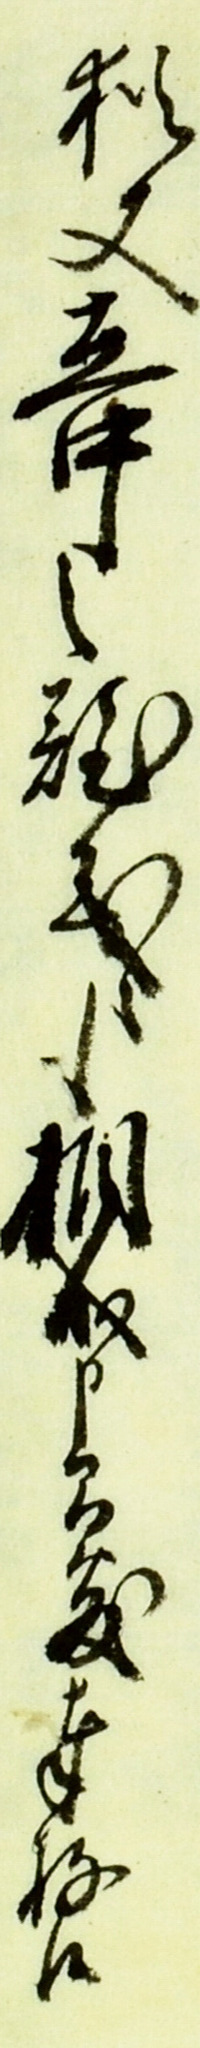猶又在中之難義ニも相成申間敷奉存候
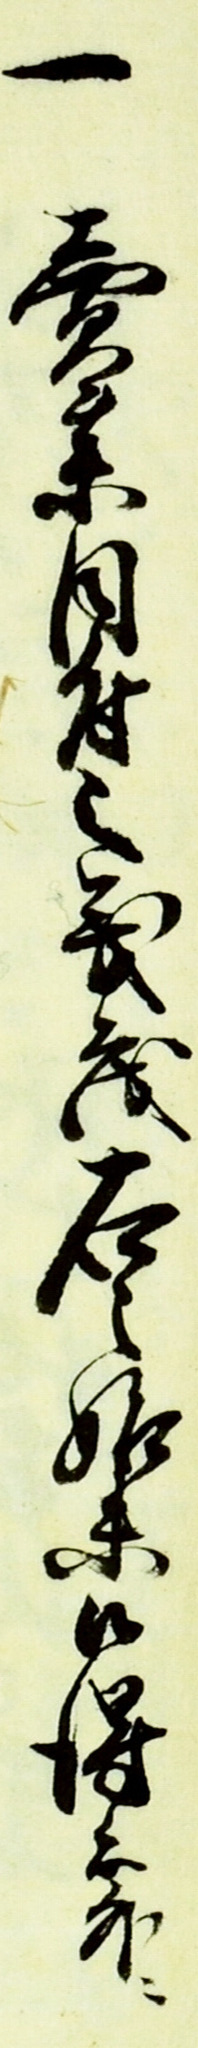一売薬目付之義茂右之始末候得而外ニ
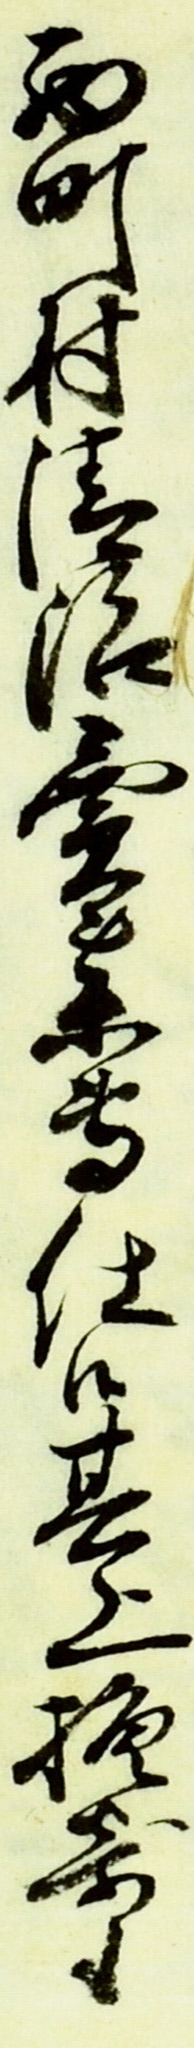西町村清治売薬専仕候其上模寄も
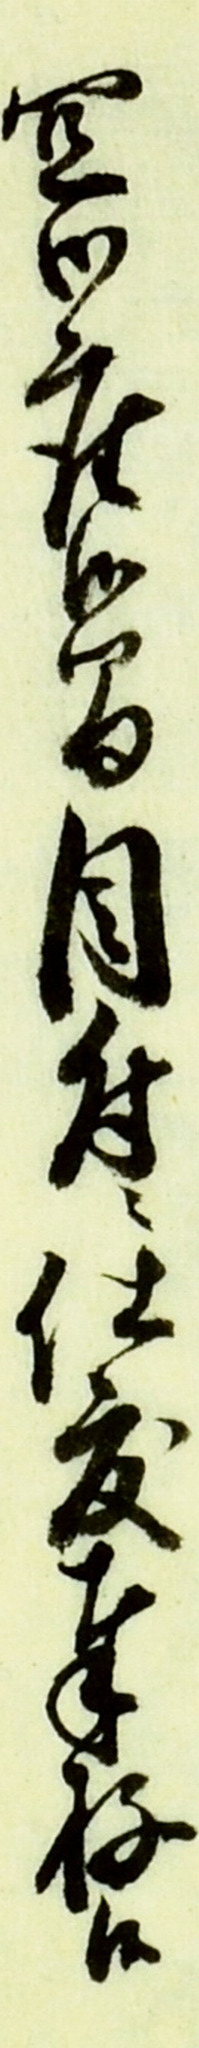宜御座候間目付ニ仕度奉存候
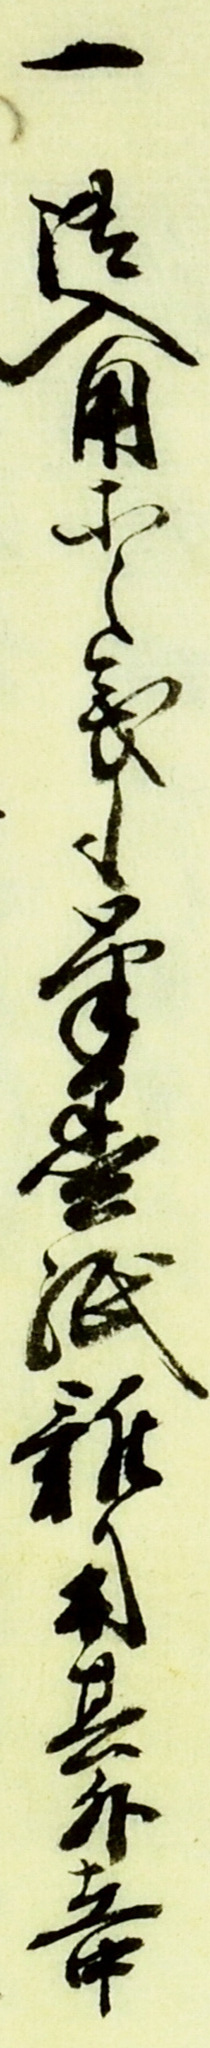一御入用等之義も筆墨紙雑用其外在中
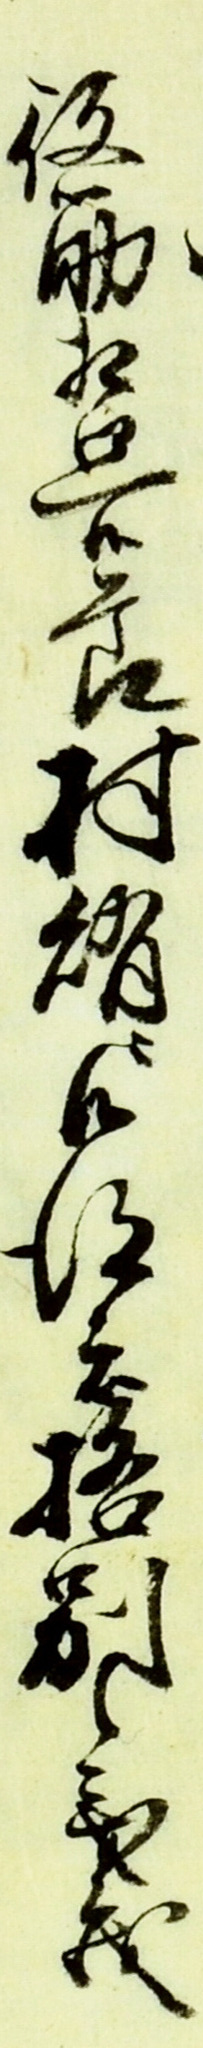役筋相廻候節村硝ニ候得者格別之義茂
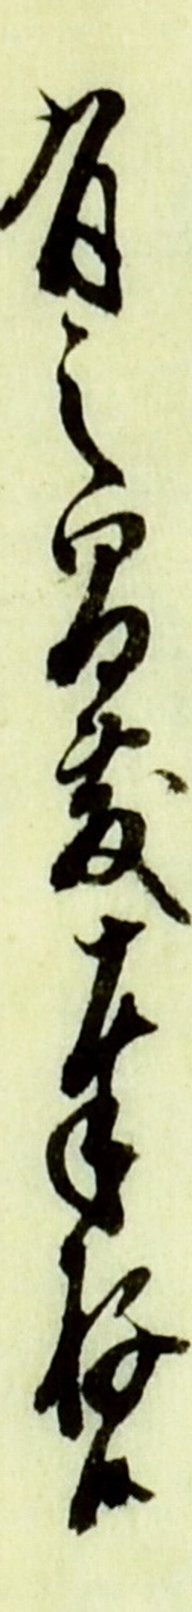有之間敷奉存候
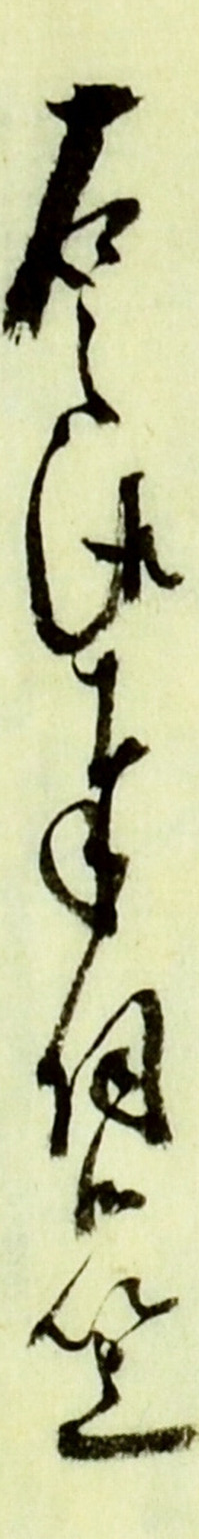右之趣奉伺候以上
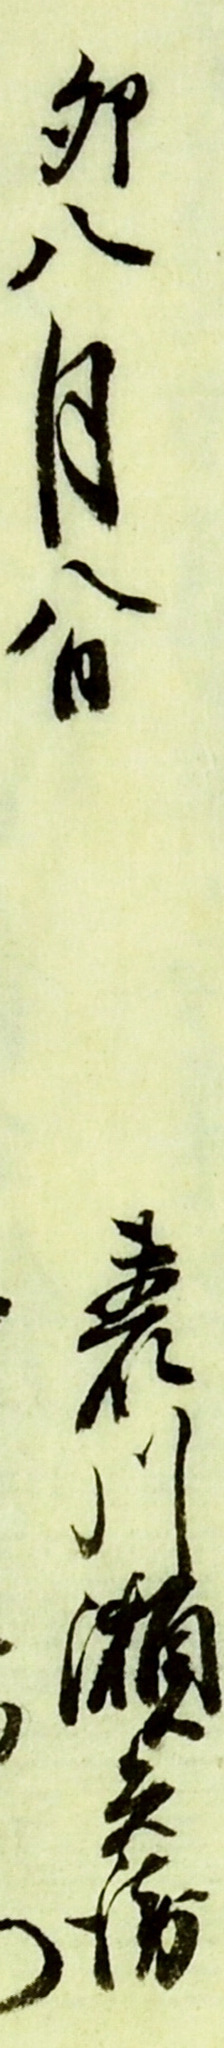卯八月八日荒川瀬兵衛
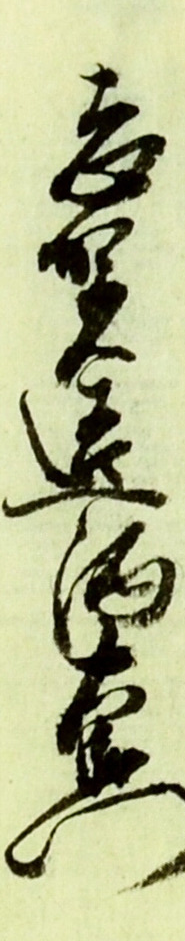志賀造酒右衛門

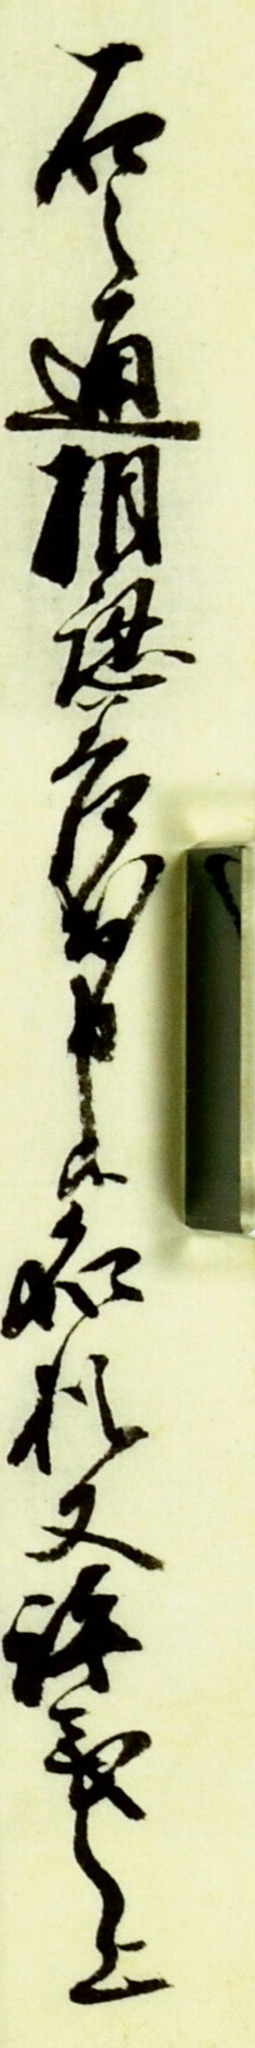右之通相認差出申候処猶又評義之上
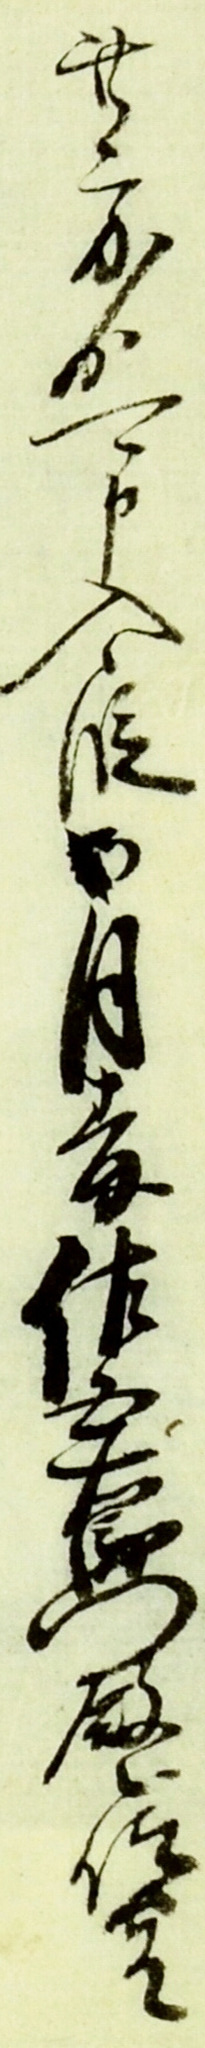此方ゟ可申入候段御月番佐五右衛門殿被仰聞候
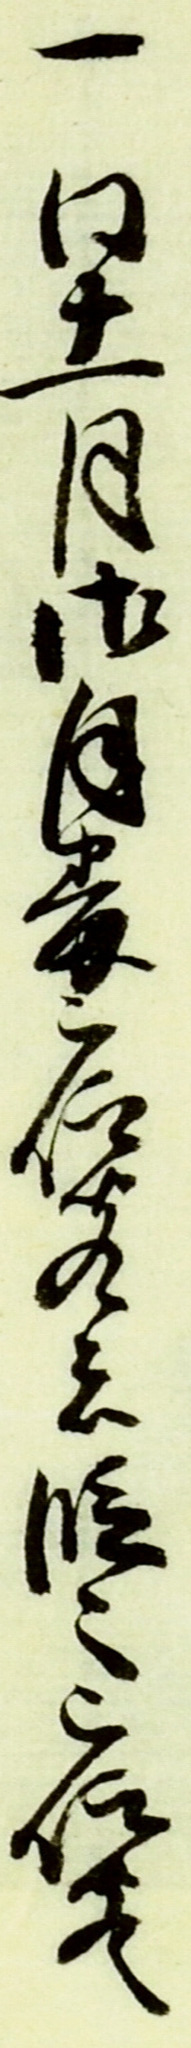一同十一月御月番被聞候者段々被仰聞候
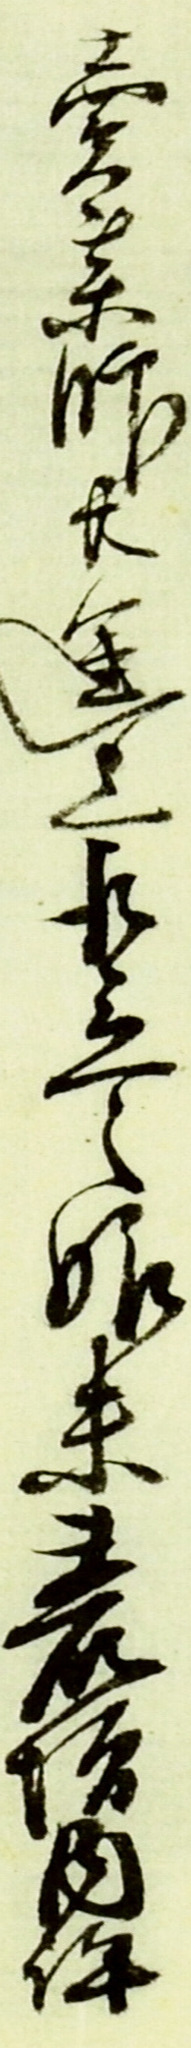売薬師共途上取立之始末荒増内許
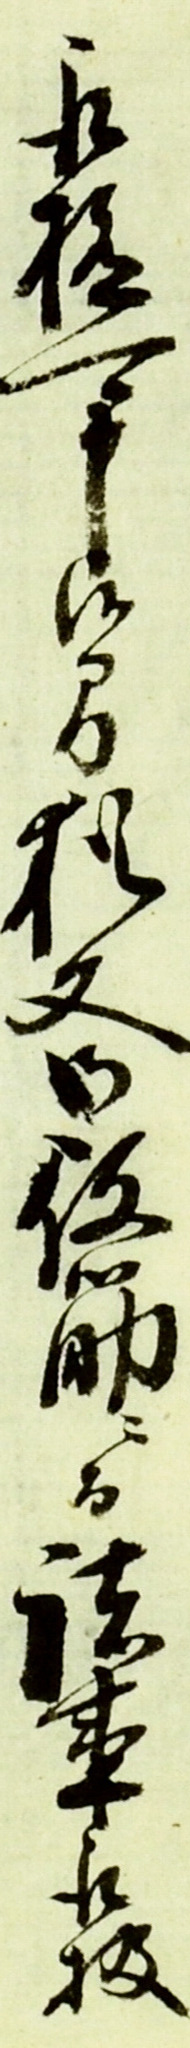取極可申候間猶又御役筋ニ而諸事取扱
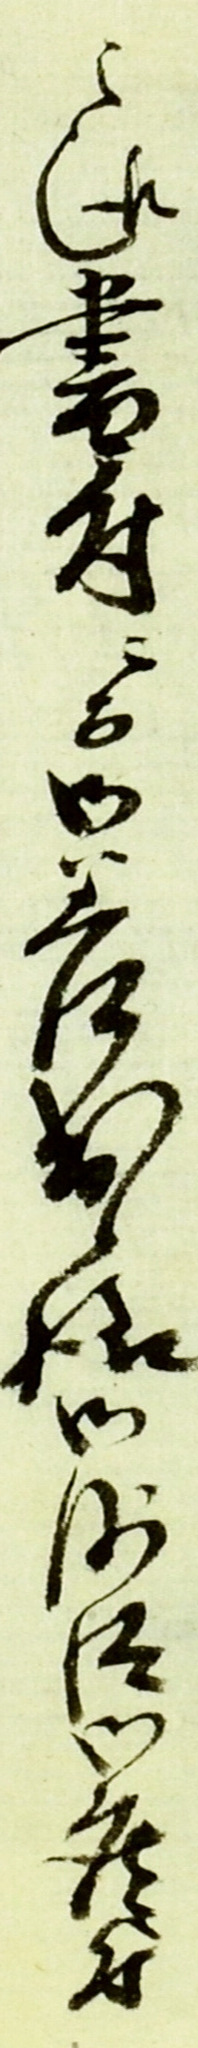之趣諸書付ニ而御差出候様御沙汰御座候ニ付
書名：他国賣薬師運上之事
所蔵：伊那市立高遠町図書館・合同会社AMANE
